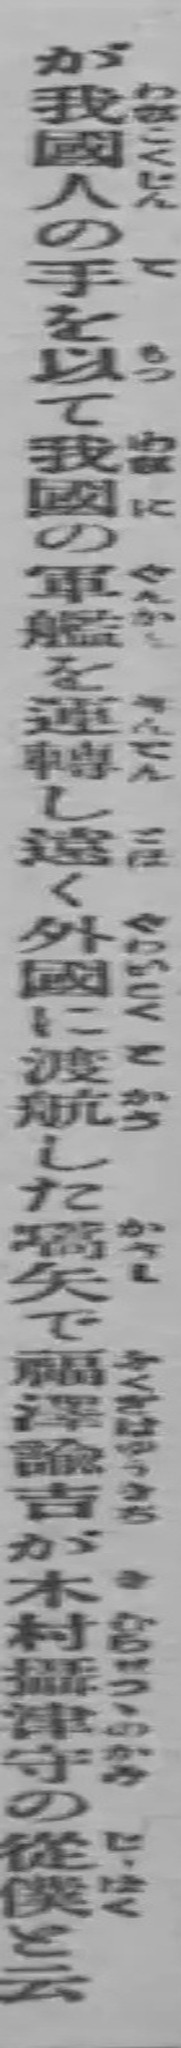が我国人の手を以て我国の軍艦を運転し遠く外国に渡航した嚆矢で福沢諭吉が木村摂津守の従僕と云
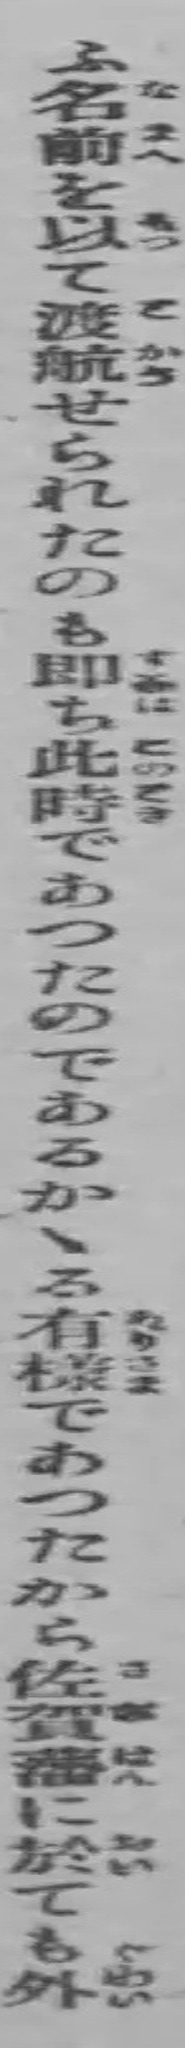ふ名前を以て渡航せられたのも即ち此時であつたのであるかゝる有様であつたから佐賀藩に於ても外
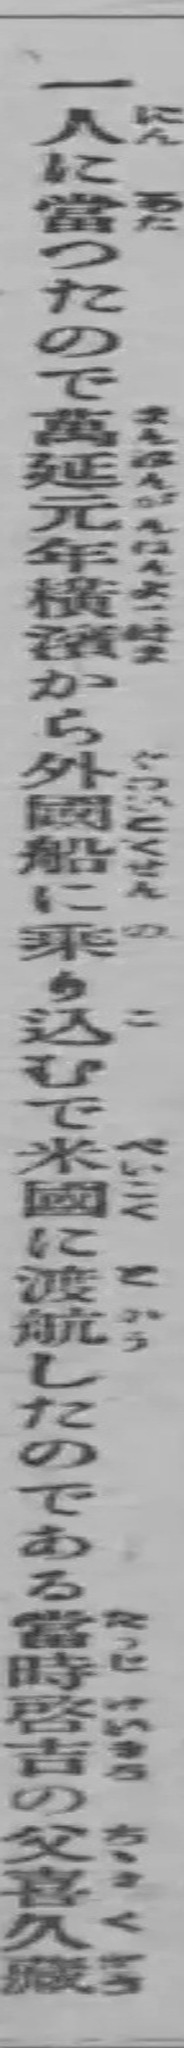一人に当つたので万延元年横浜から外国船に乗り込むで米国に渡航したのである当時啓吉の父喜久蔵
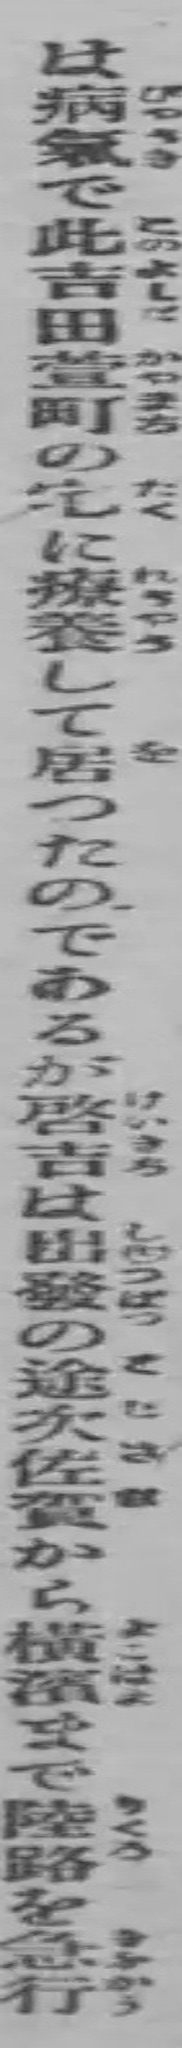は病気で此吉田萱町の宅に療養して居つたのであるが啓吉は出発の途次佐賀から横浜まで陸路を急行
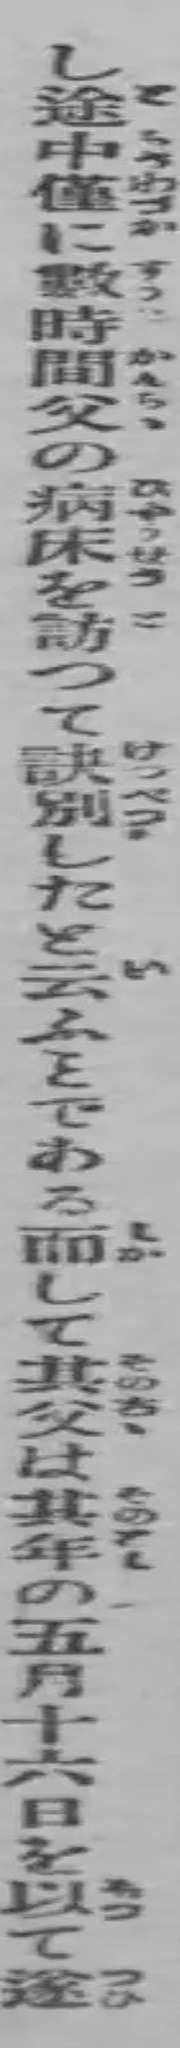し途中僅に数時間父の病床を訪つて訣別したと云ふことである而して其父は其年の五月十六日を以て遂
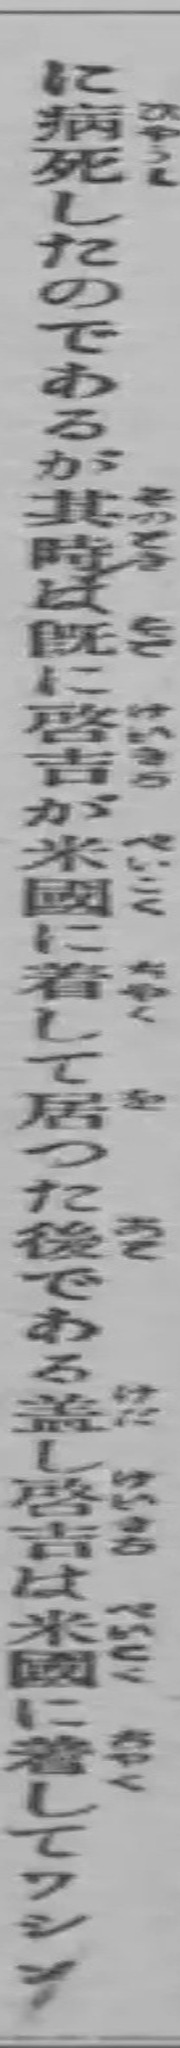に病死したのであるが其時は既に啓吉が米国に着して居つた後である蓋し啓吉は米国に着してワシン
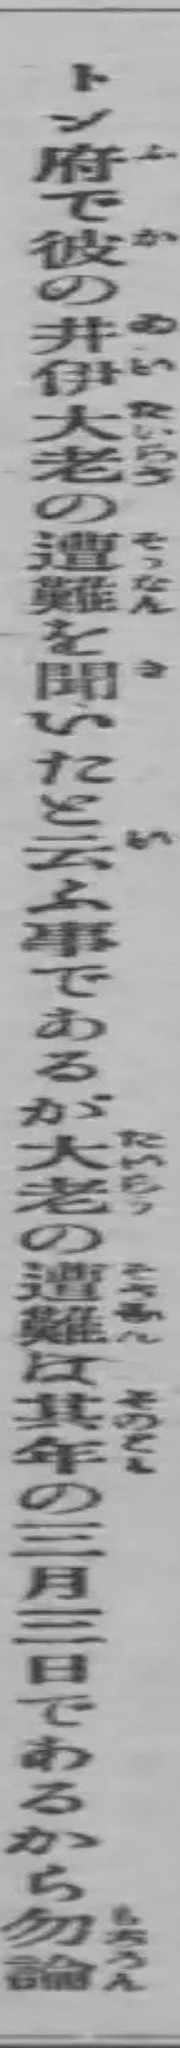トン府で彼の井伊大老の遭難を聞いたと云ふ事であるが大老の遭難は其年の三月三日であるから勿論
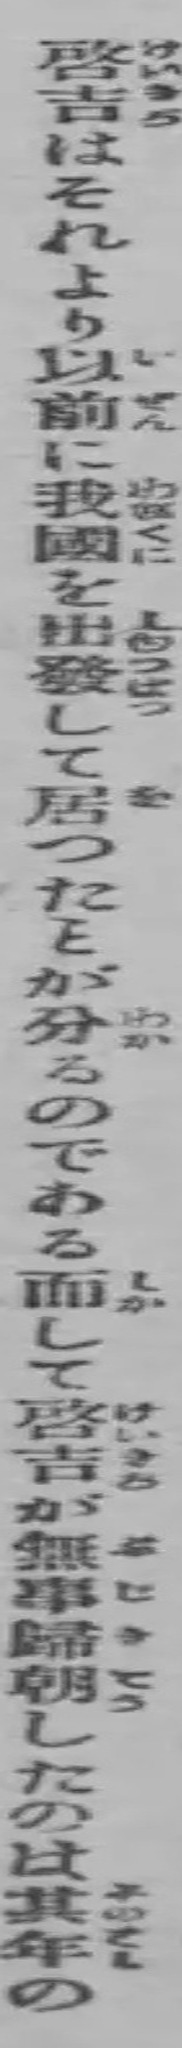啓吉はそれより以前に我国を出発して居つたことが分るのである而して啓吉が無事帰朝したのは其年の
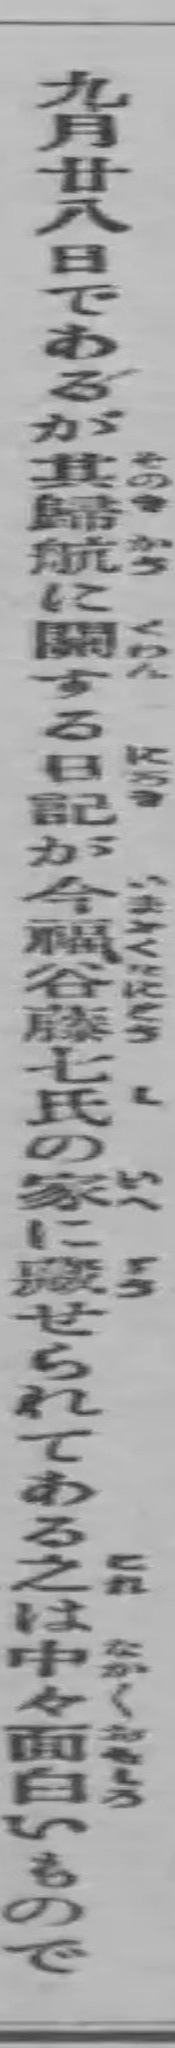九月廿八日であるが其帰航に関する日記が今福谷藤七氏の家に蔵せられてあるが之は中々面白いもので
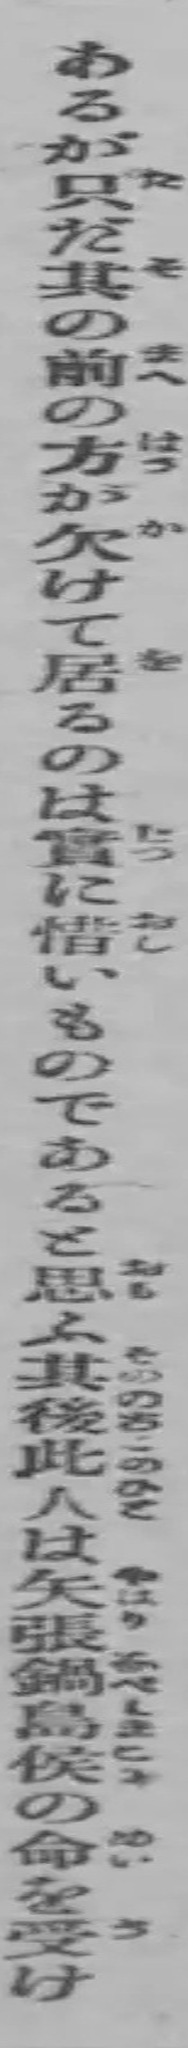あるが只だ其の前の方が欠けて居るのは実に惜いものであると思ふ此後此人は矢張鍋島侯の命を受け
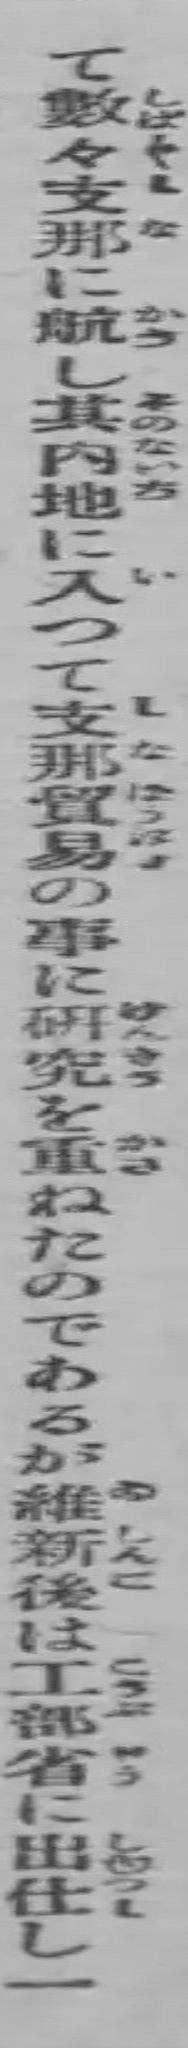て数々支那に航し其内地に入つて支那貿易の事に研究を重ねたのであるが維新後は工部省に出仕し一
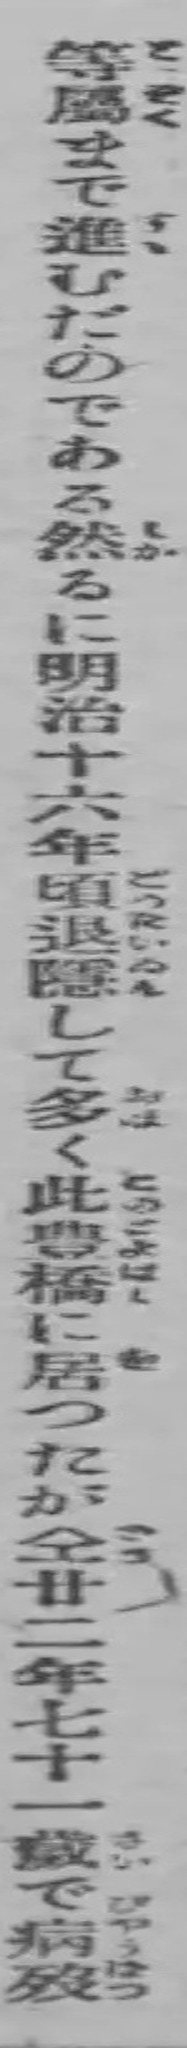等属まで進むだのである然るに明治十六年頃退隠して多く此豊橋に居つたが仝廿二年七十一歳で病歿
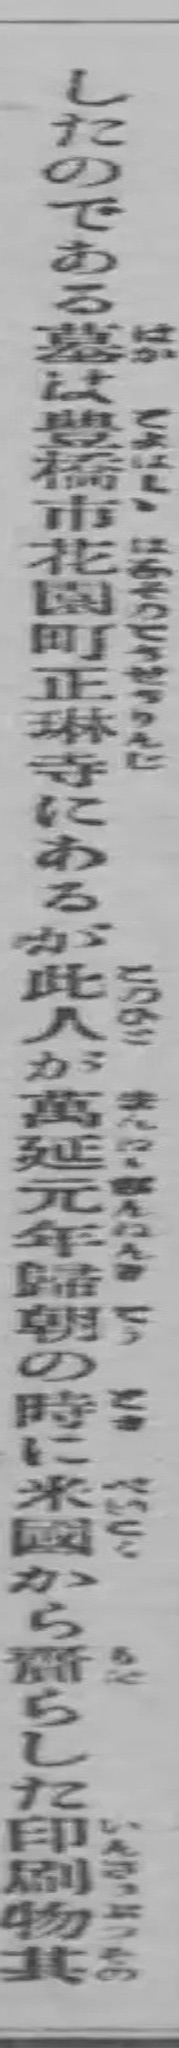したのである墓は豊橋市花園町正琳寺にあるが此人が万延元年帰朝の時に米国から齎らした印刷物其
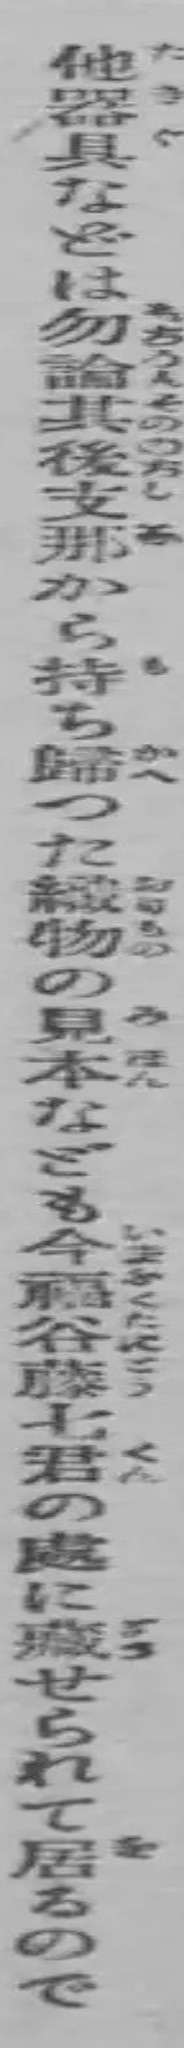他器具などは勿論其後支那から持ち帰つた織物の見本なども今福谷藤七君の処に蔵せられて居るので
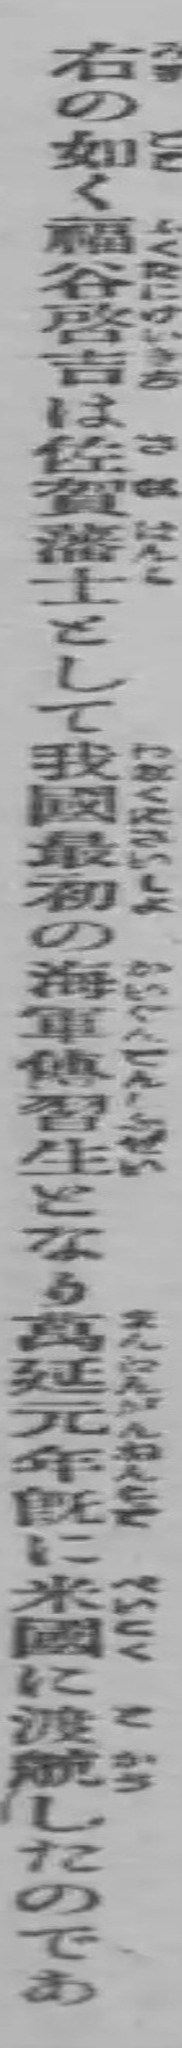右の如く福谷啓吉は佐賀藩士として我国最初の海軍伝習生となり万延元年既に米国に渡航したのであ
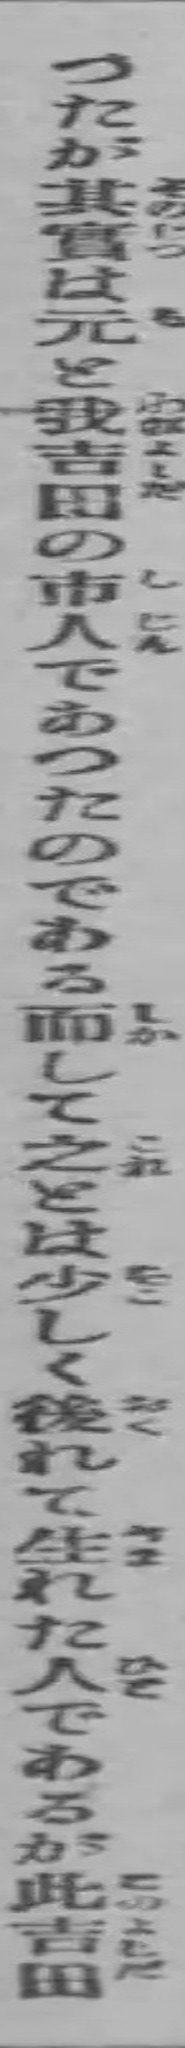穂積晴軒つたが其実は元と我吉田の市人であつたのである而し之とは少しく後れて生れた人であるが此吉田
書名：豊橋市史談
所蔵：国立国会図書館 National Diet Library, JAPAN
